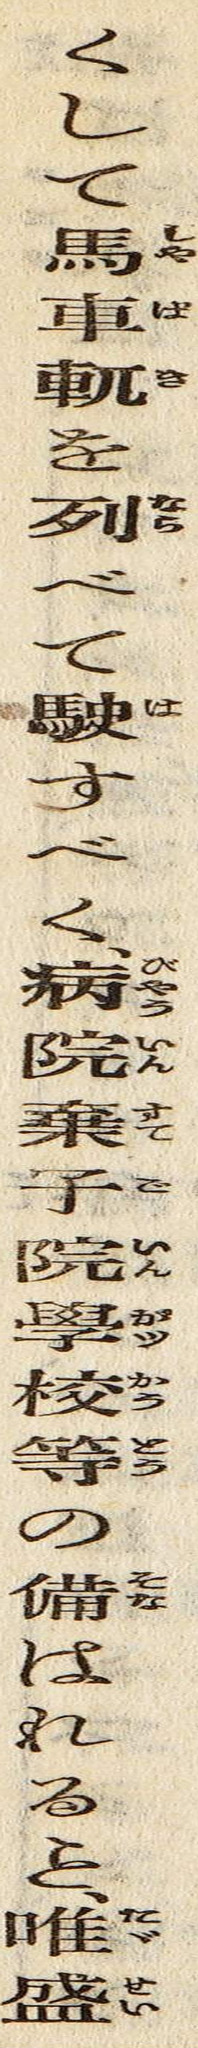くして馬車軌を列べて駛すべく、病院棄子院学校等の備はれること、唯盛
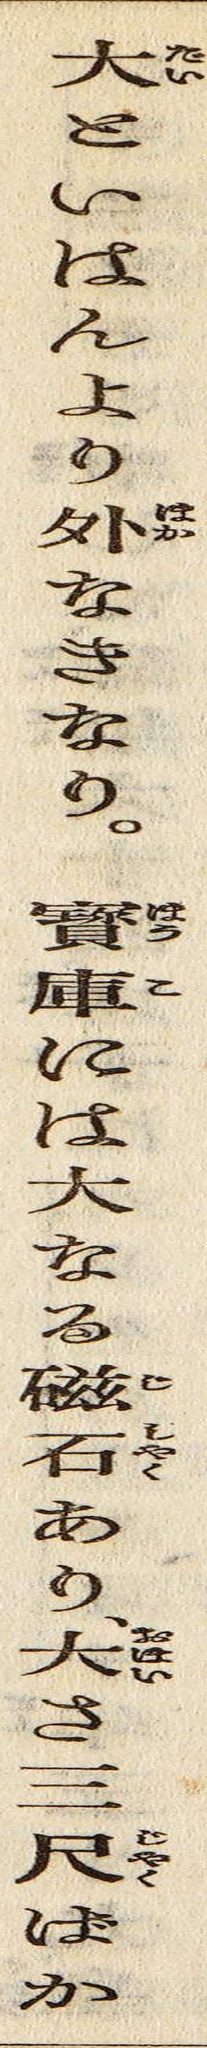大といはんより外なきなり。宝庫には大なる磁石あり、大さ三尺ばか
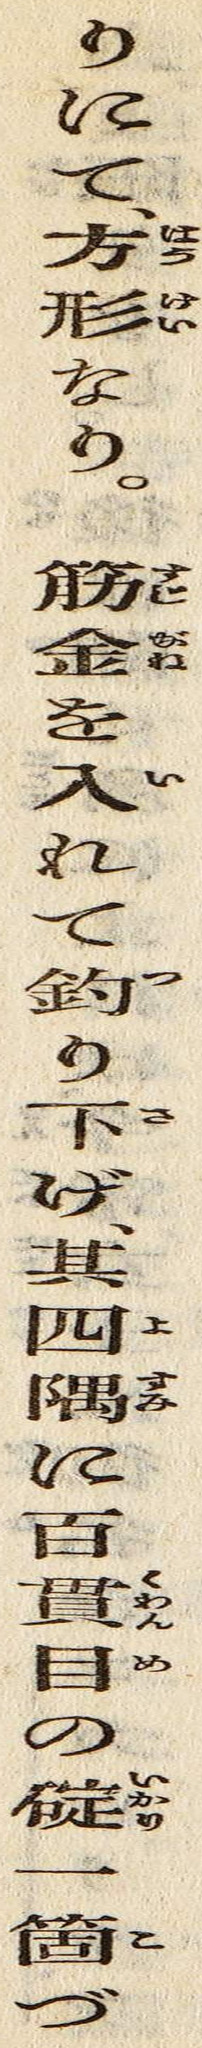りにて、方形なり。筋金を入れて釣り下げ、其四隅に百貫目の碇一箇づ
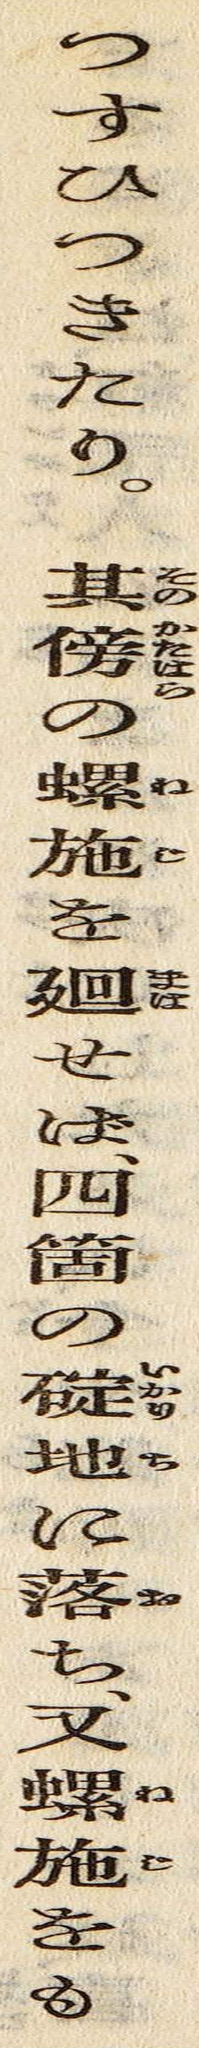つすひつきたり。其傍の螺施を廻せば、四箇の碇地に落ち、又螺施をも
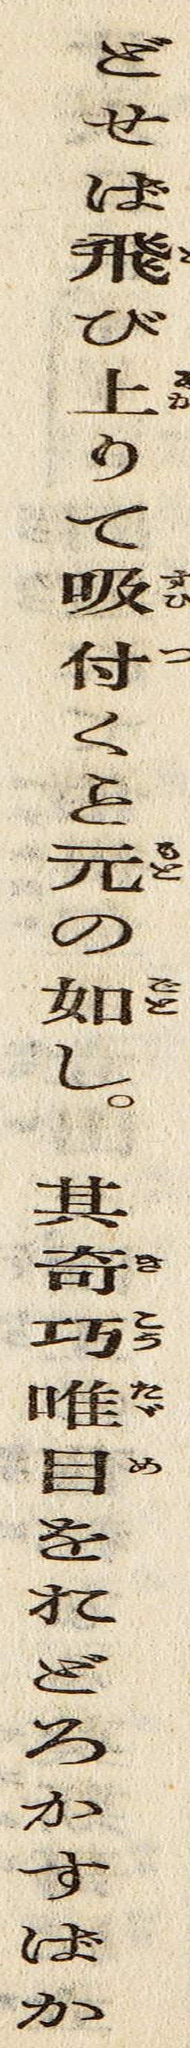どせば飛び上りて吸付くこと元の如し。其奇功唯目をおどろかすばか
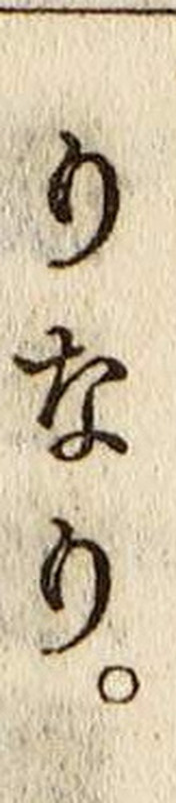りなり。
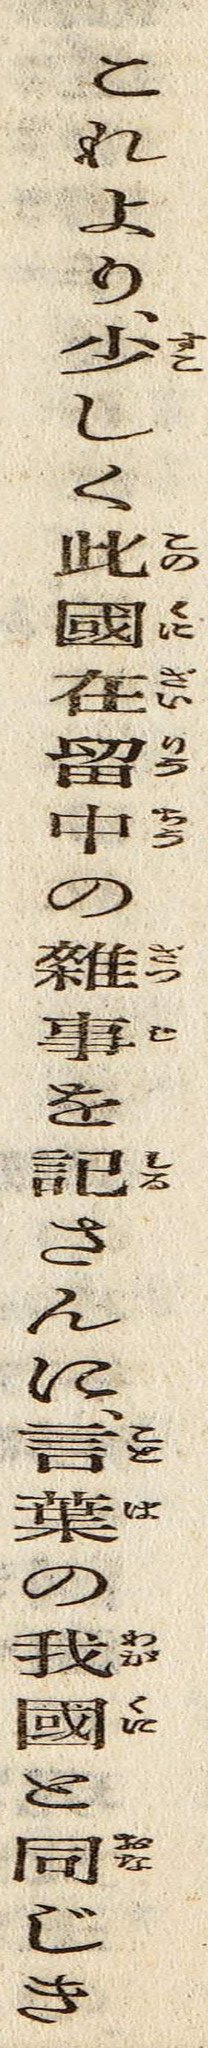これより、少しく此国在留中の雑事を記さんに、言葉の我国と同じき
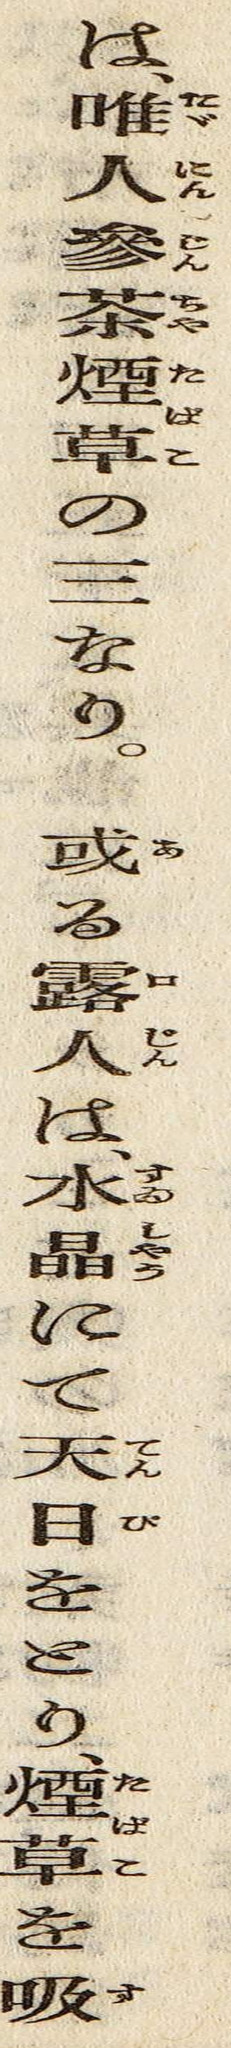は、唯人参茶煙草の三なり。或る露人は、水晶にて天日をとり、煙草を吸
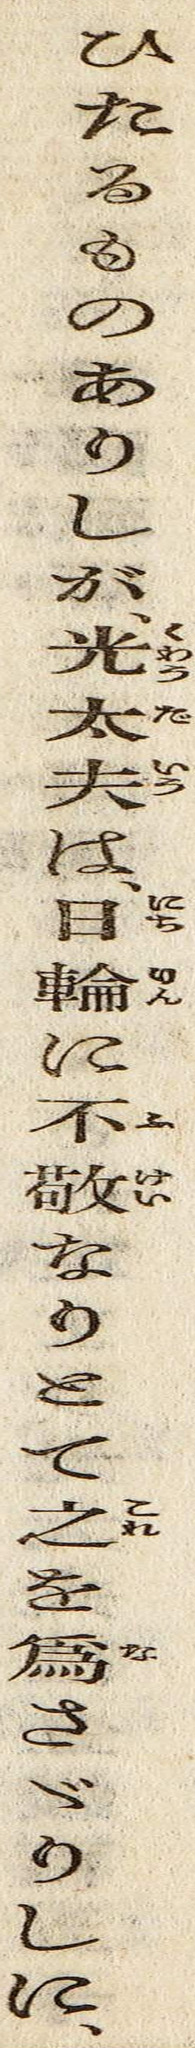ひたるものありしが、光太夫は、日輪に不敬なりとて之を為さゞりしに、
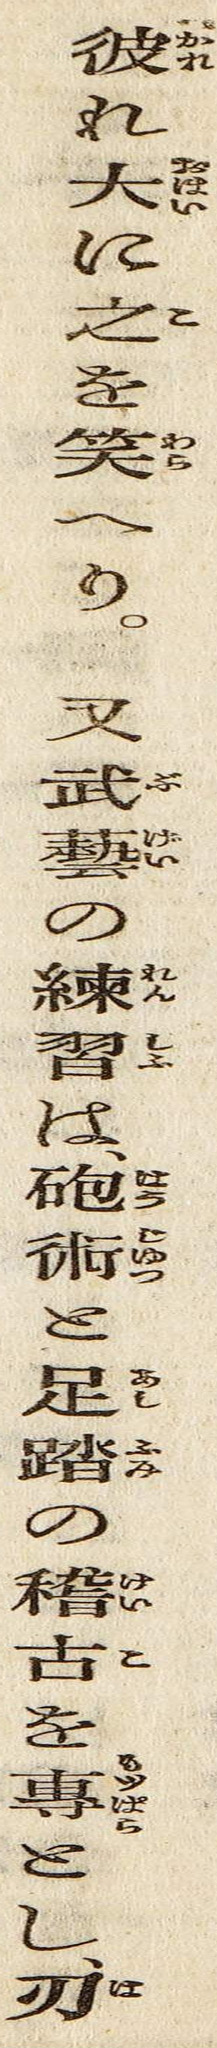彼れ大に之を笑へり。又武芸の練習は、砲術と足踏の稽古を専とし、刃
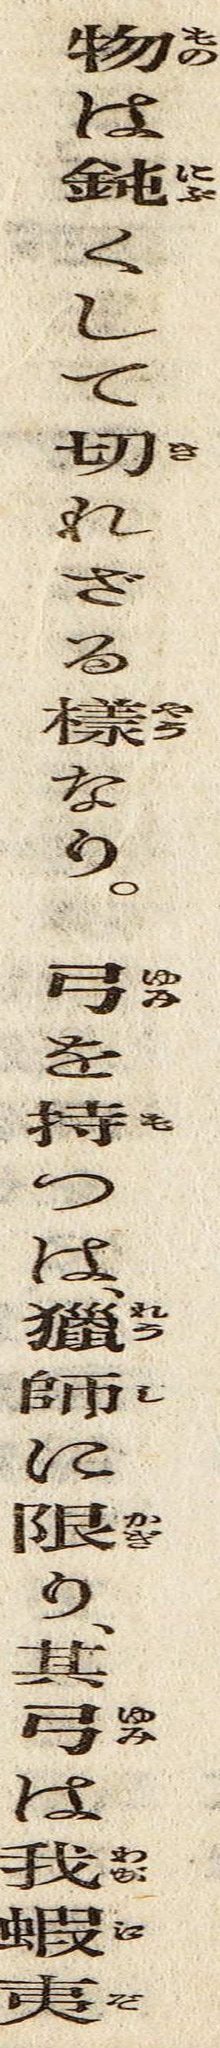物は鈍くして切れざる様なり。弓を持つは、猟師に限り、其弓は我蝦夷
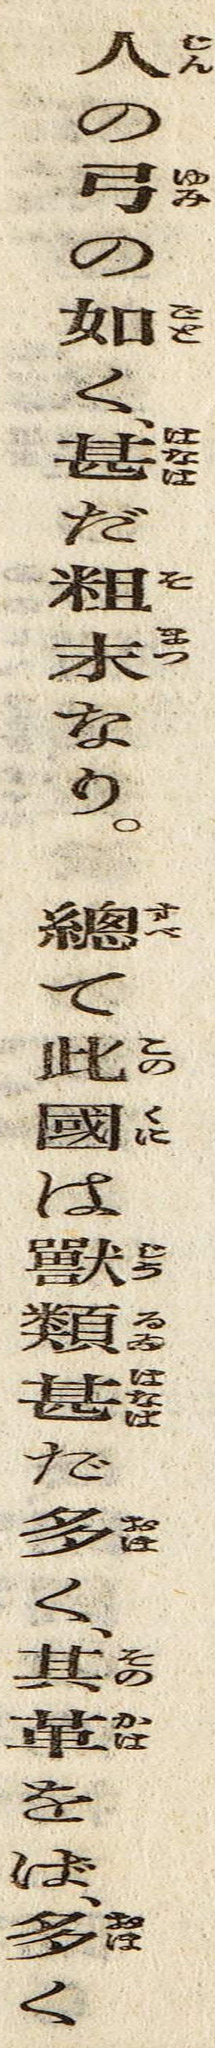人の弓の如く、甚だ粗末なり。総て此国は獣類甚だ多く、其革をば、多く
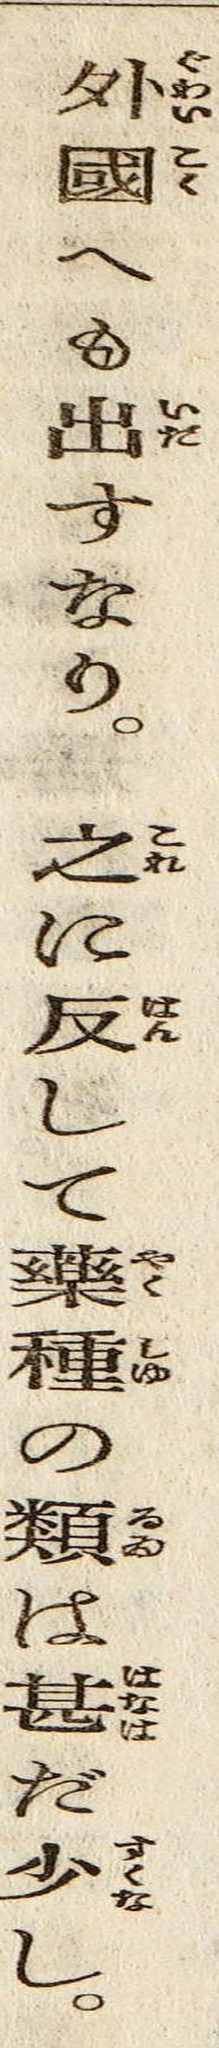外国へも出すなり。之に反して薬種の類は甚だ少し。
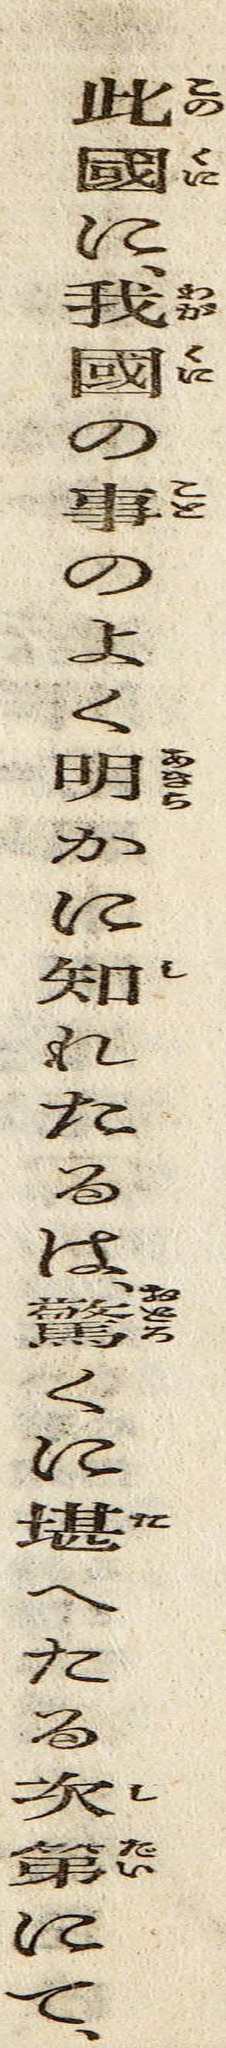此国に、我国の事のよく明かに知れたるは、驚くに堪へたる次第にて、
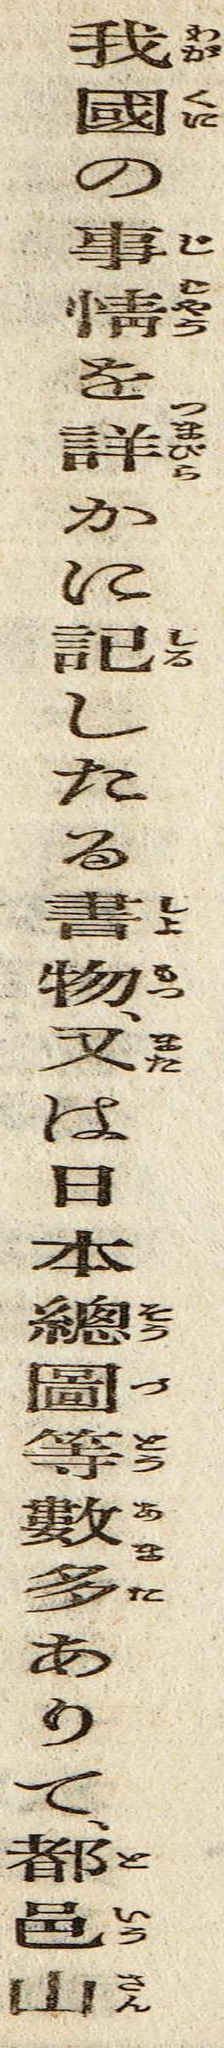我国の事情を詳かに記したる書物、又は日本総図等数多ありて、都邑山
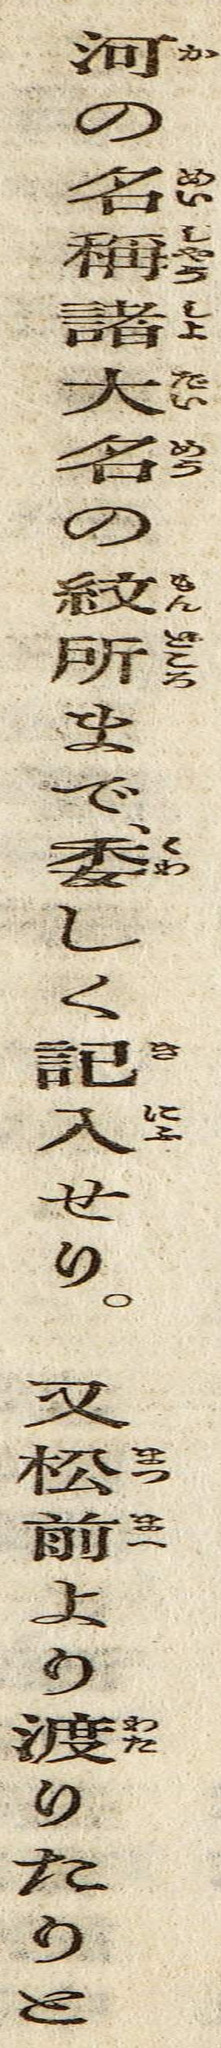河の名称諸大名の紋所まで、委しく記入せり。又松前より渡りたりと
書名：日本漂流譚
